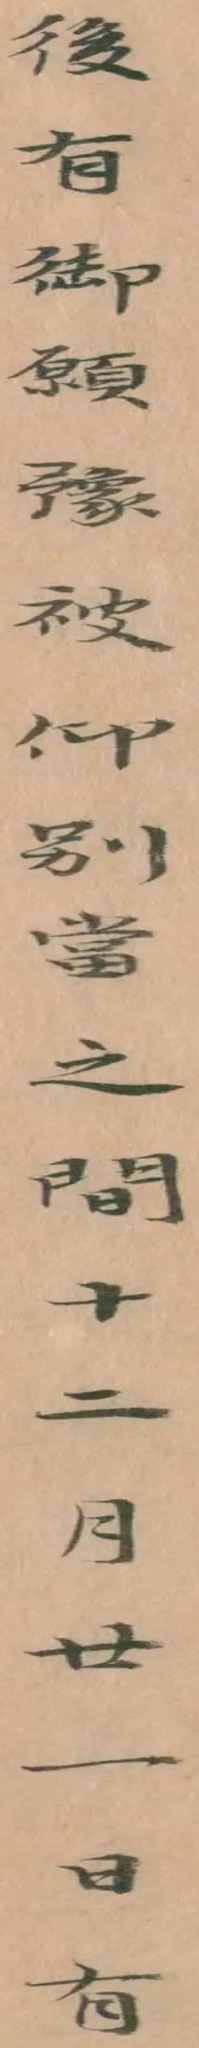後有御願予被仰別当之間十二月廿一日有

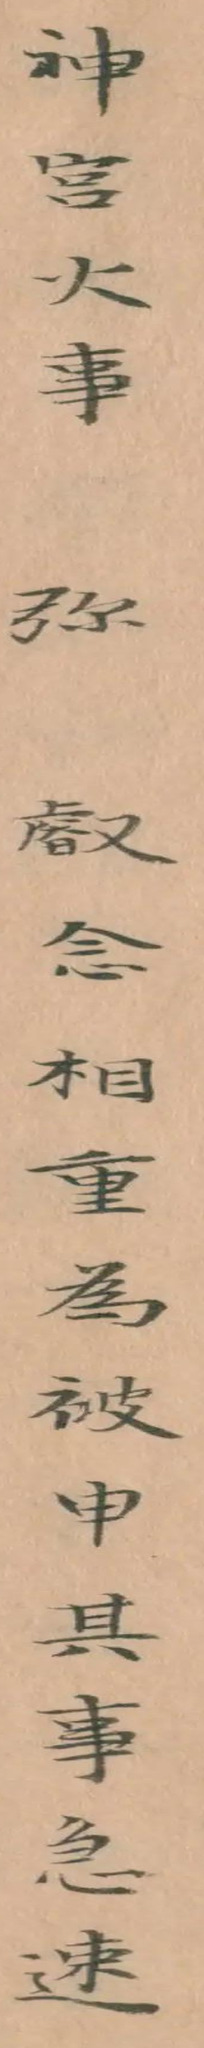神宮火事弥叡念相重為被申其事急速
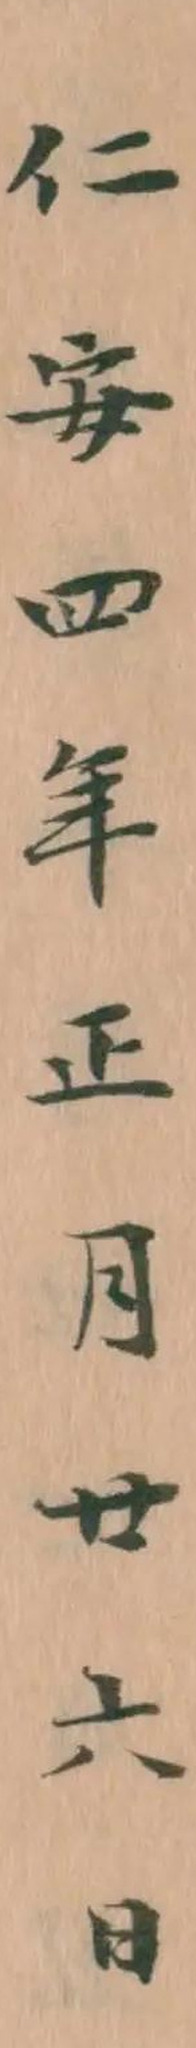仁安四年正月廿六日
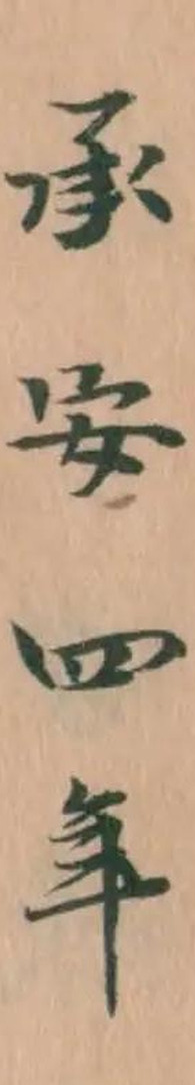承安四年
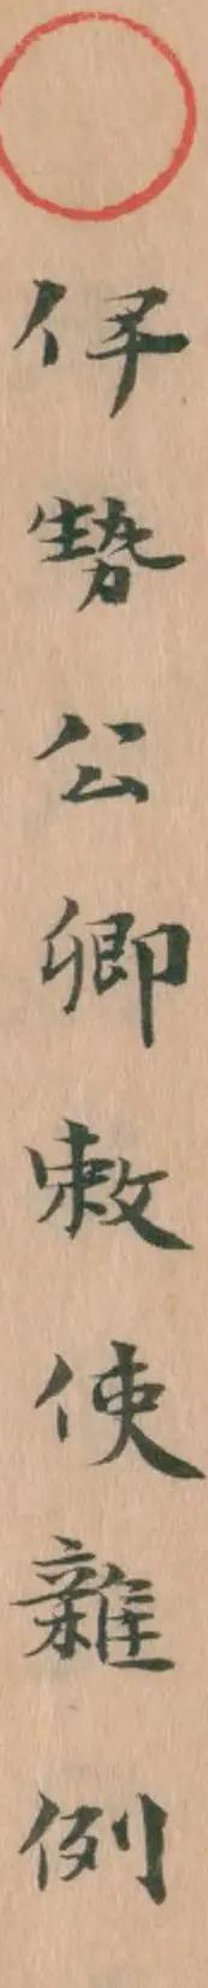○伊勢公卿敇使雑例
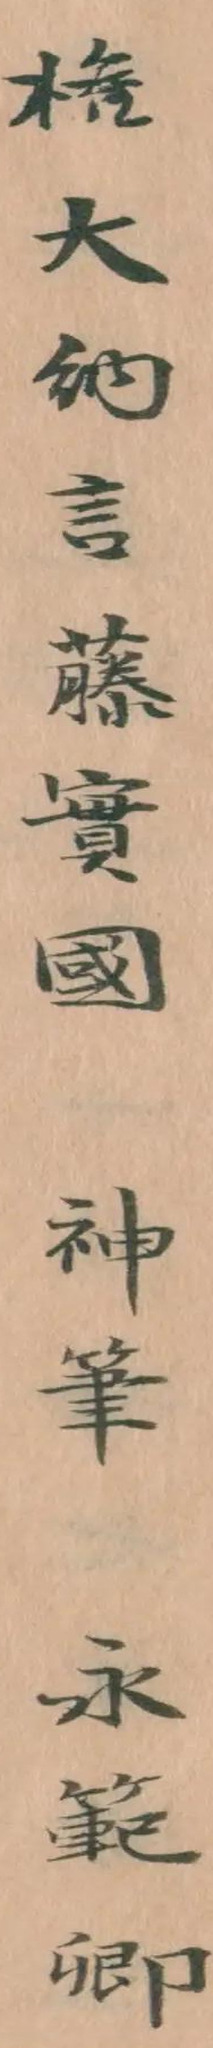権大納言藤実国神筆永範卿
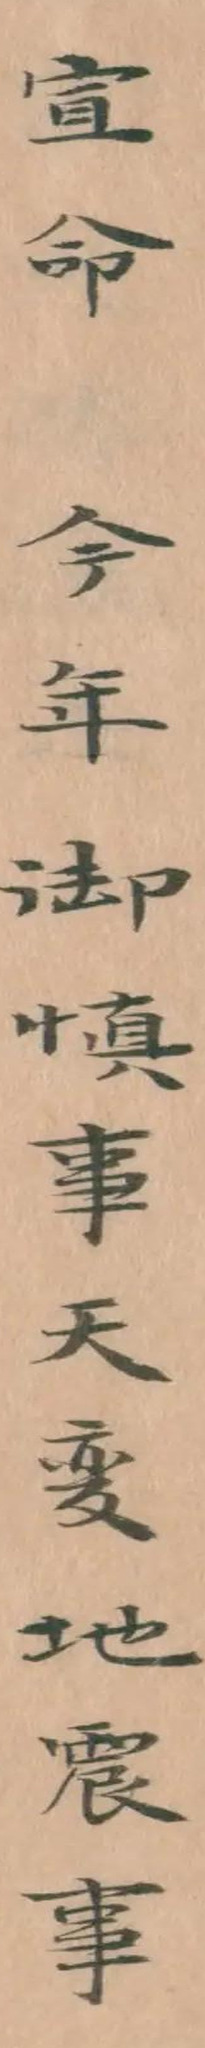宣命今年御慎事天変地震事

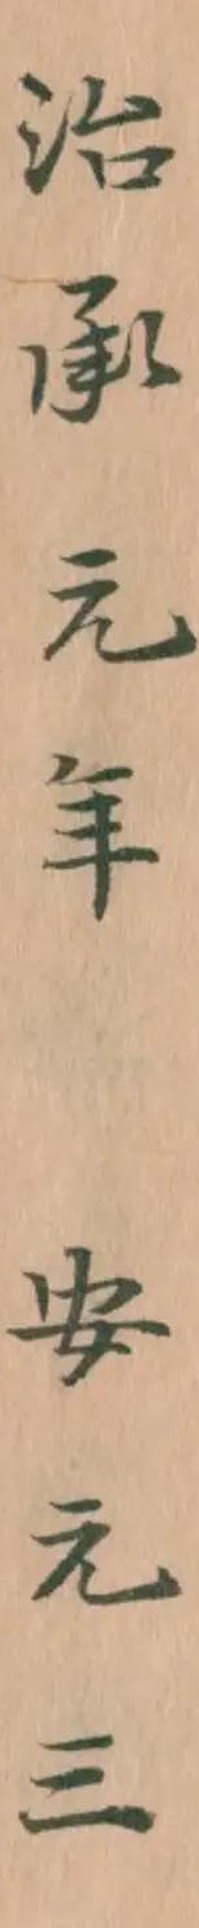治承元年安元三
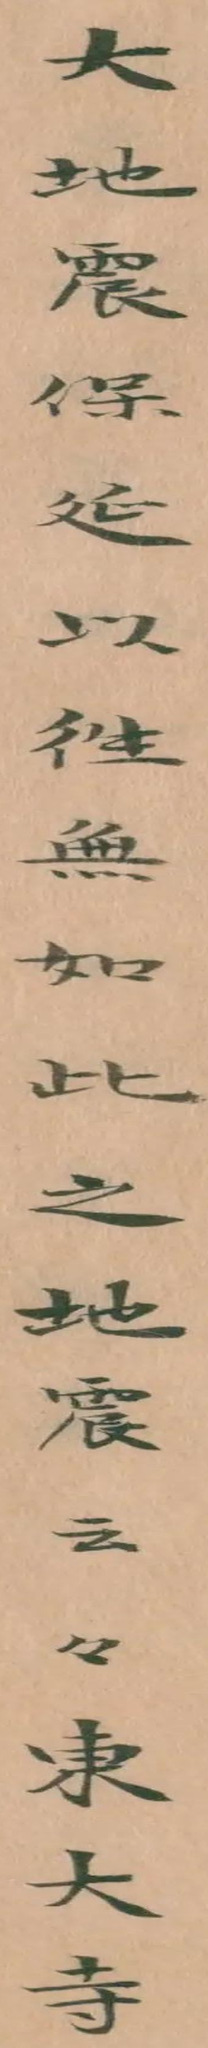大地震保延以往無如此之地震云々東大寺
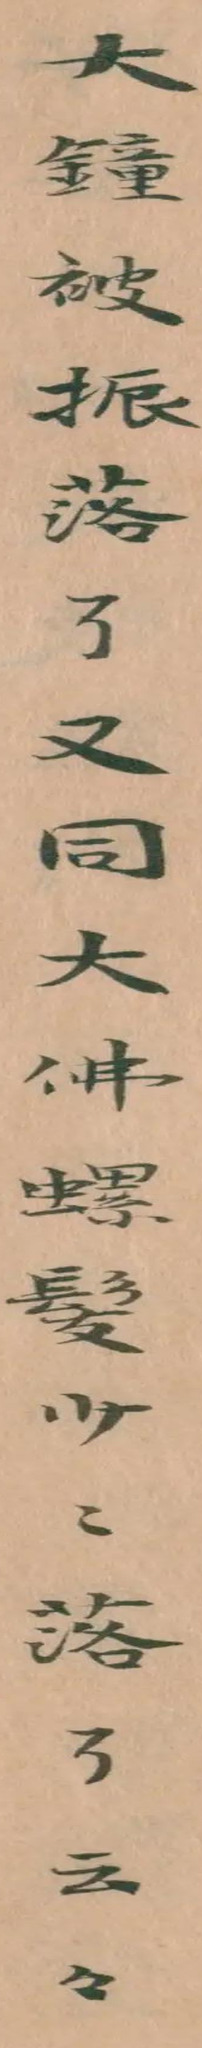大鐘被振落了又同大仏螺髪少々落了云々
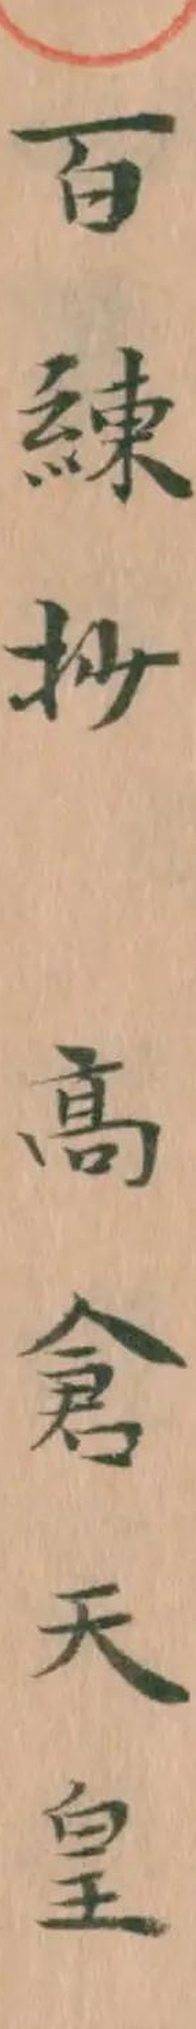○百練抄高倉天皇
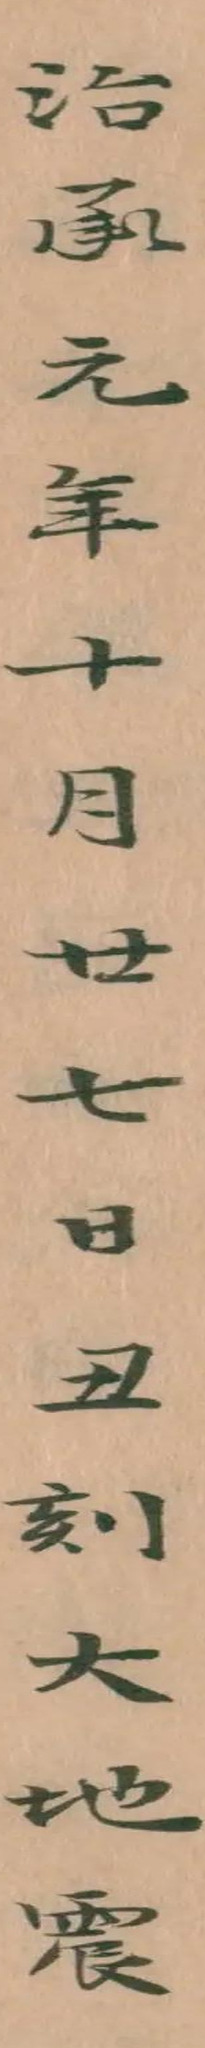治承元年十月廿七日丑刻大地震
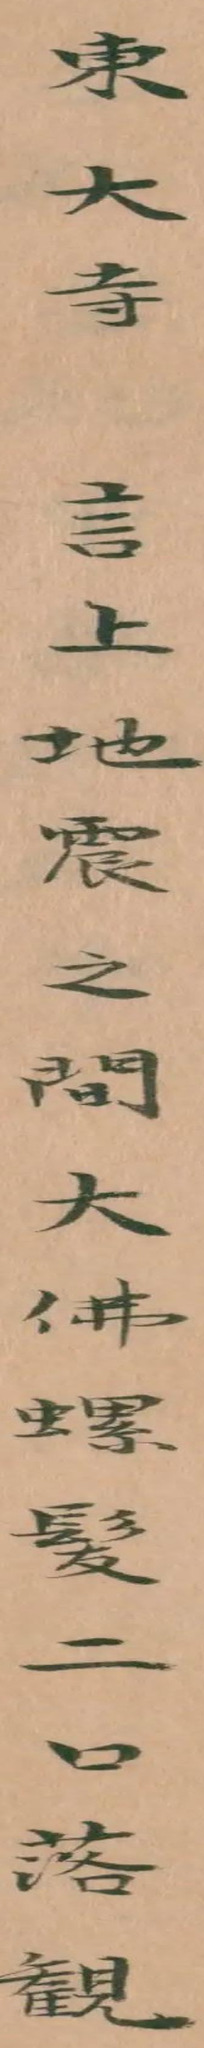東大寺言上地震之間大仏螺髪二口落観
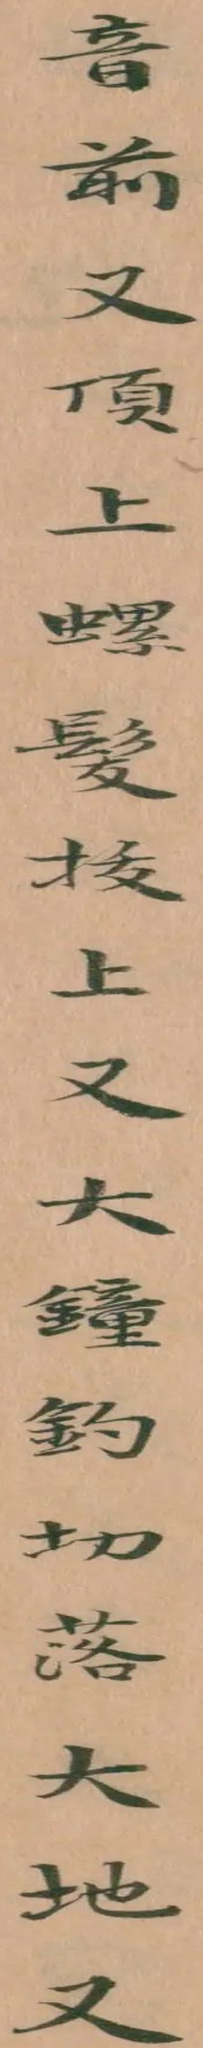音前又頂上螺髪抜上又大鐘釣切落大地又
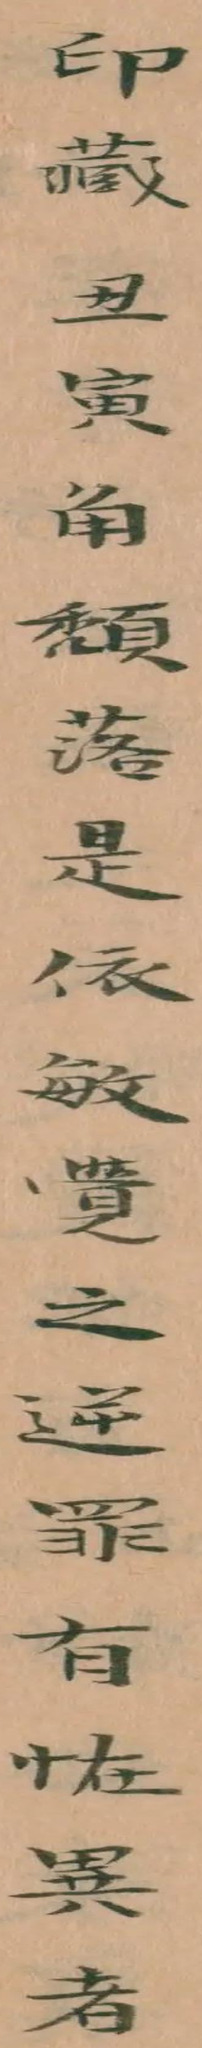印蔵丑寅角頽落是依敏覚之逆罪有恠異者
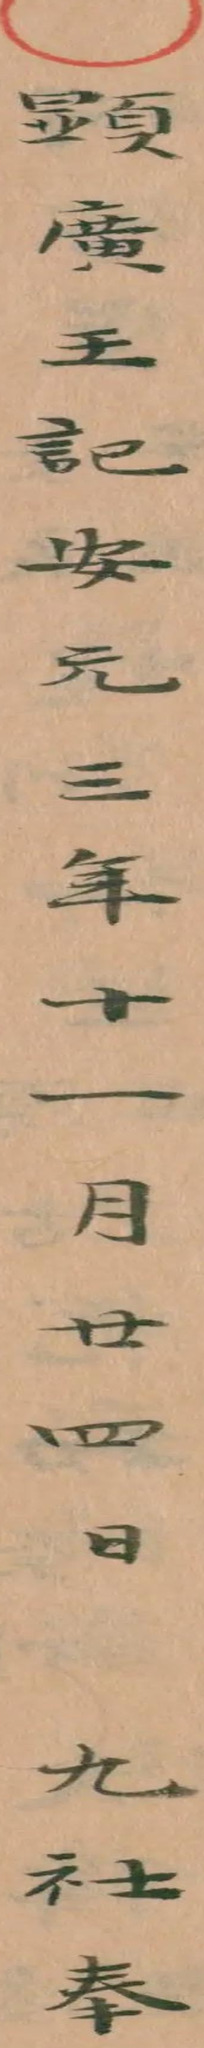○顕広王記安元三年十一月廿四日九社奉
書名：地災撮要. 巻5-6(地震之部)
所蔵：国立国会図書館 National Diet Library, JAPAN
